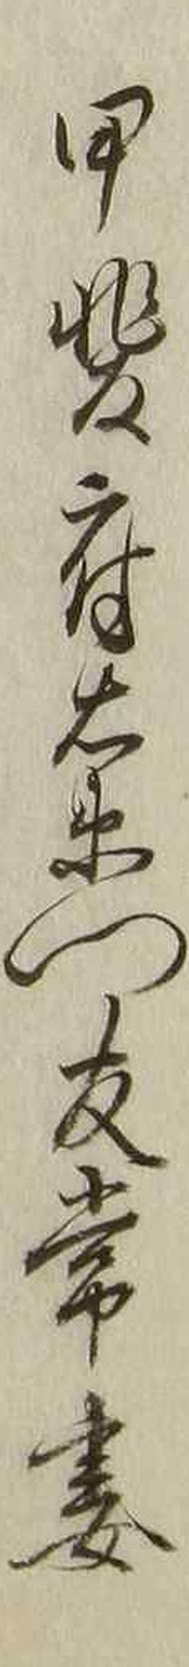女甲斐府右衛門友常妻
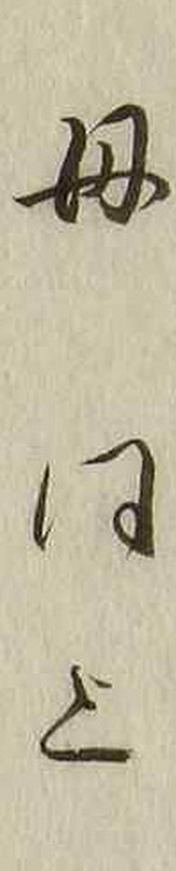母同上
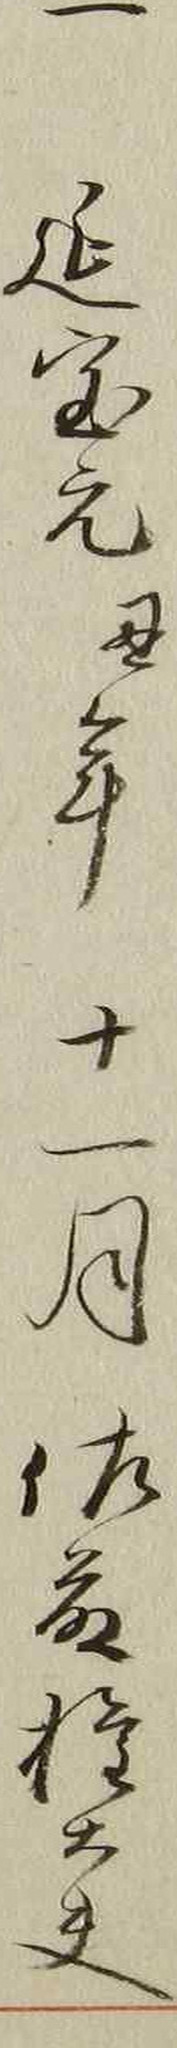一延宝元丑年十一月佐藤権大夫
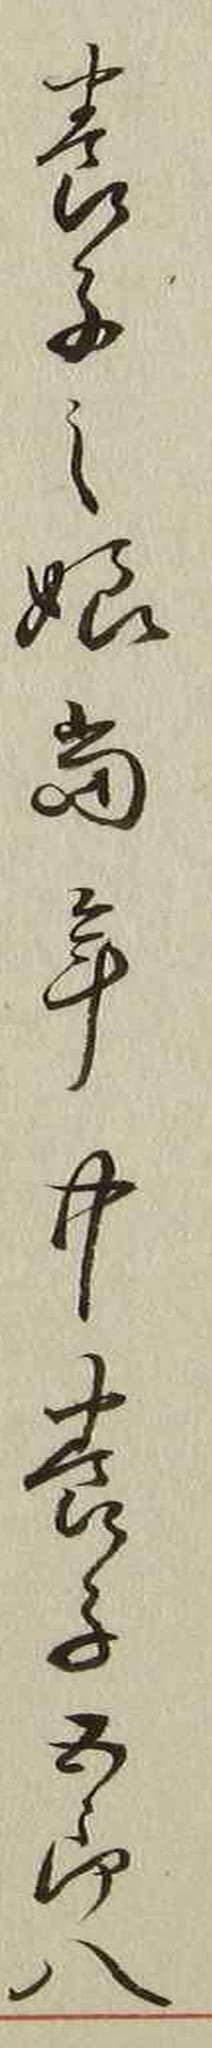養子之娘当年中養子五郎八
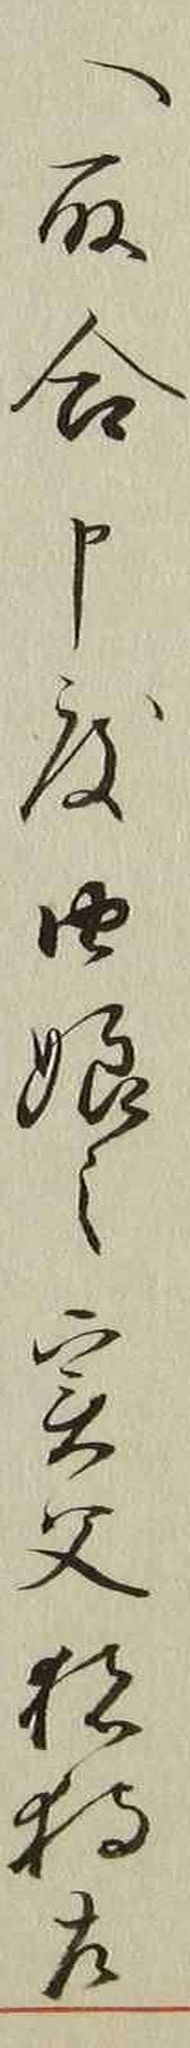へ取合申度由娘之実父猪狩左
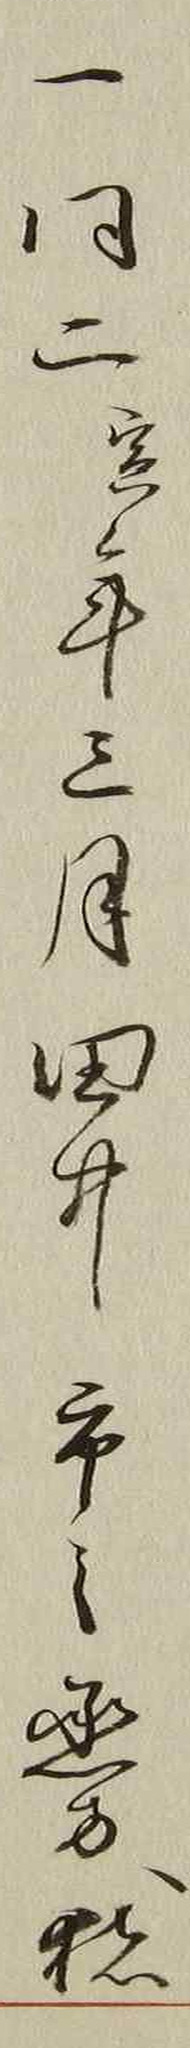一同二寅年三月田中市々丞方へ猪
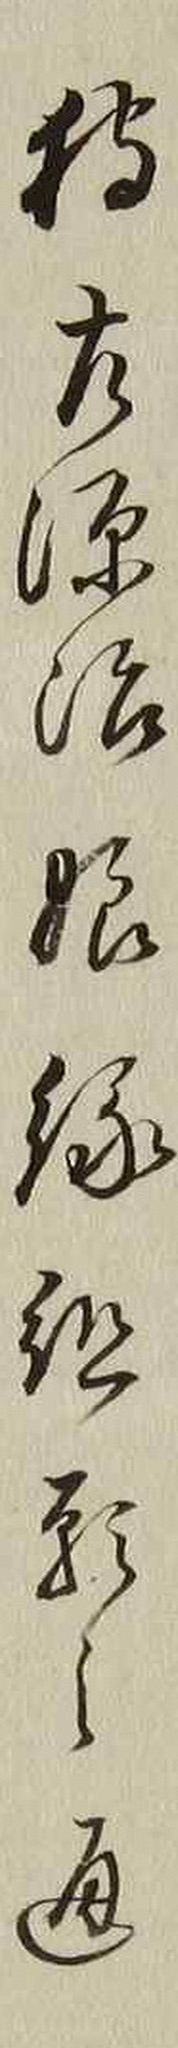狩左源治娘縁組願之通
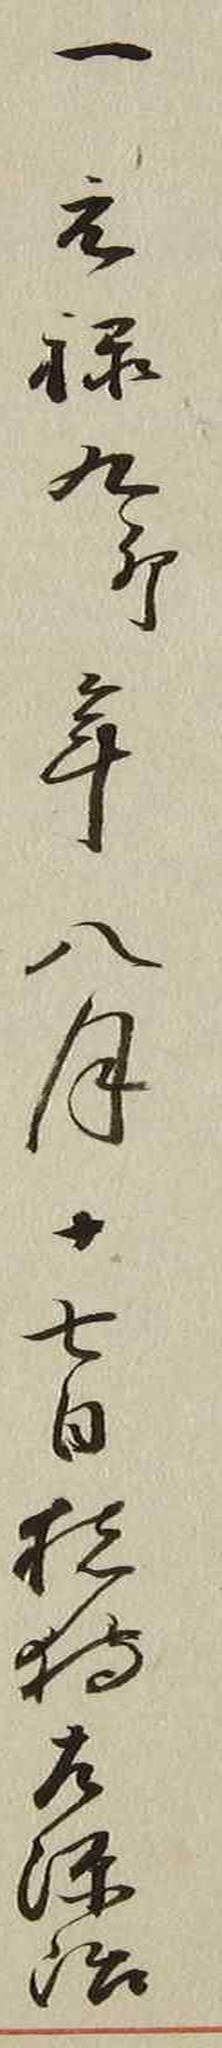一元禄九卯年八月十七日猪狩左源治
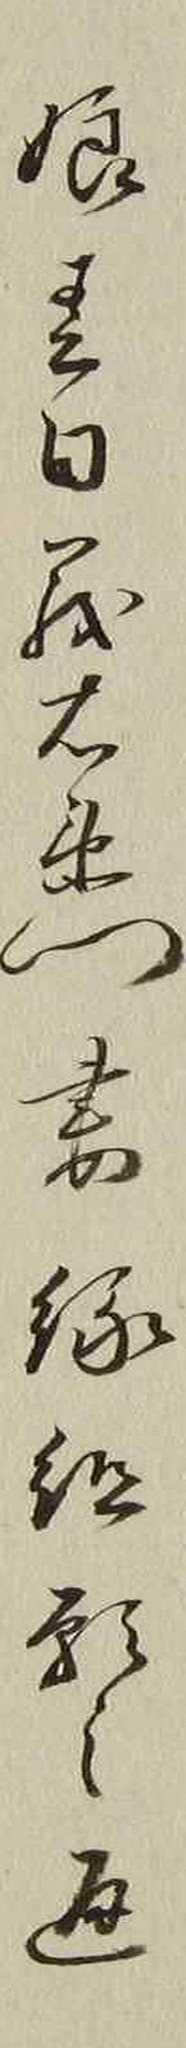娘春日義右衛門妻縁組願之通
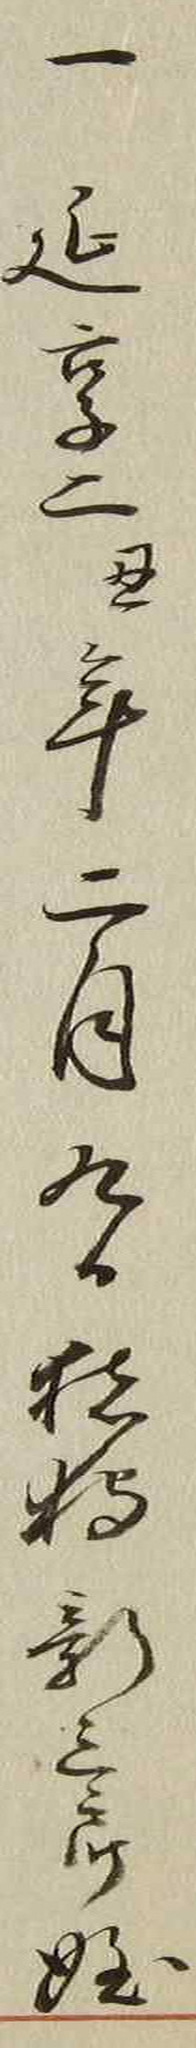一延享二丑年二月九日猪狩新三郎姪
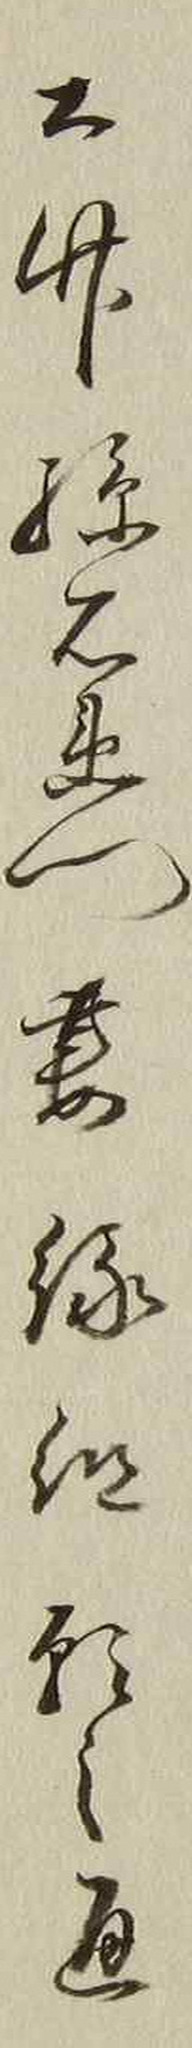大竹孫右衛門妻縁組願之通
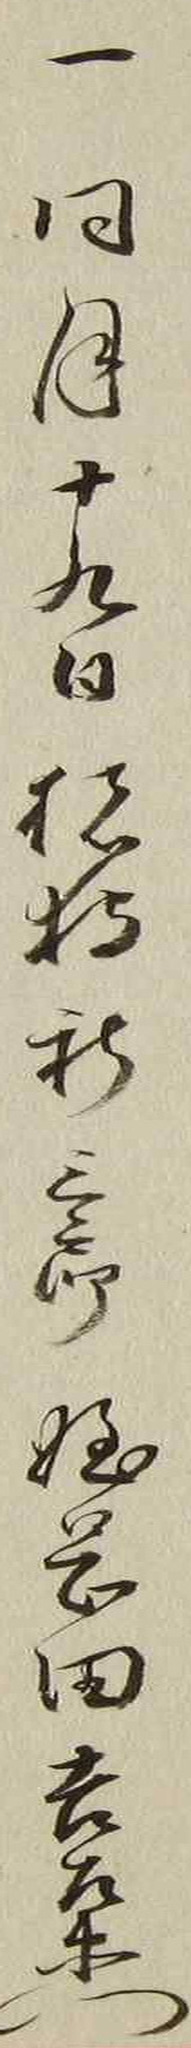一同月十九日猪狩新三郎姪岡田吉左衛門
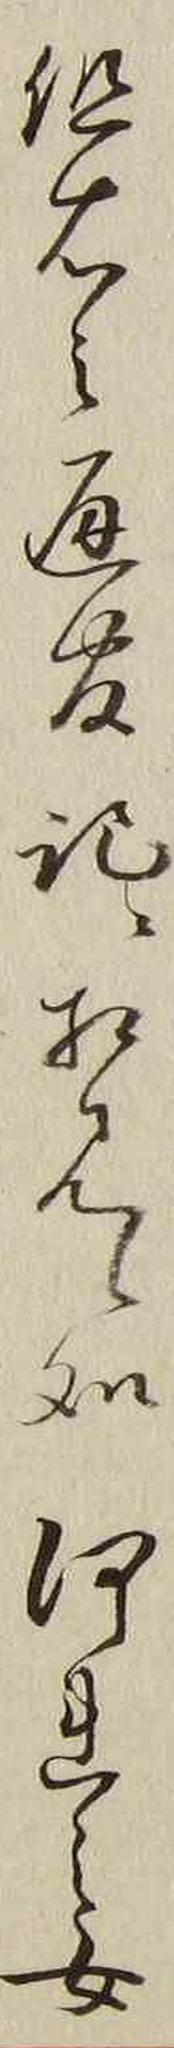但右之通官記ニ相見候処何れ之女
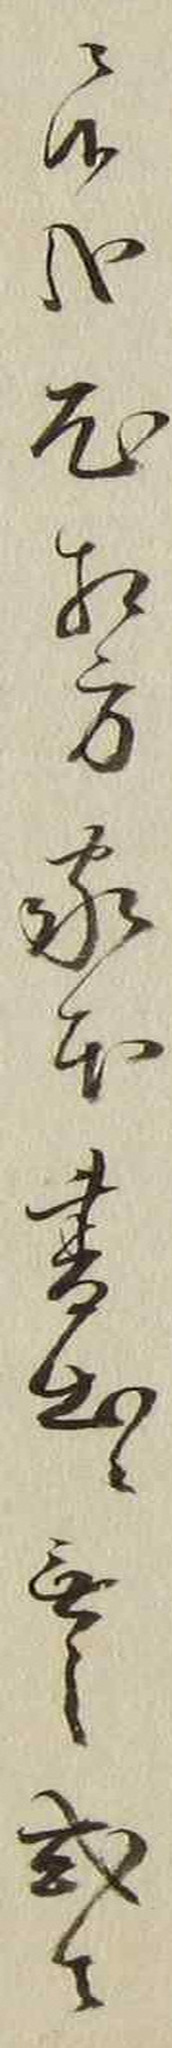ニ候哉尤相方家本書出ニ無之或者
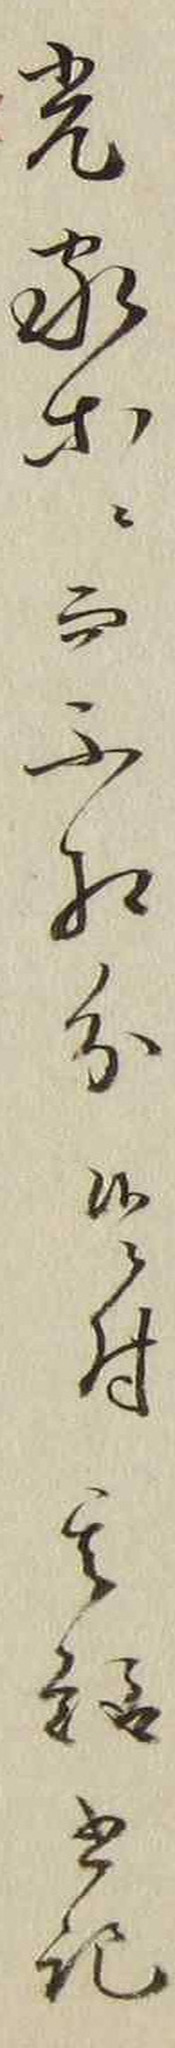光家等ニ而不相分候ニ付其趣書記

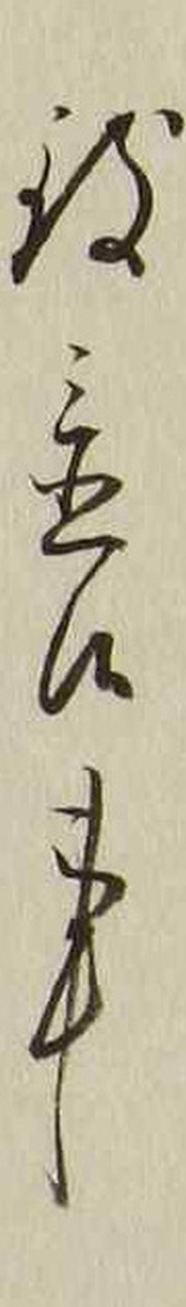致置候事
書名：諸士系譜　巻之28　い之部28
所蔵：会津若松市立会津図書館
